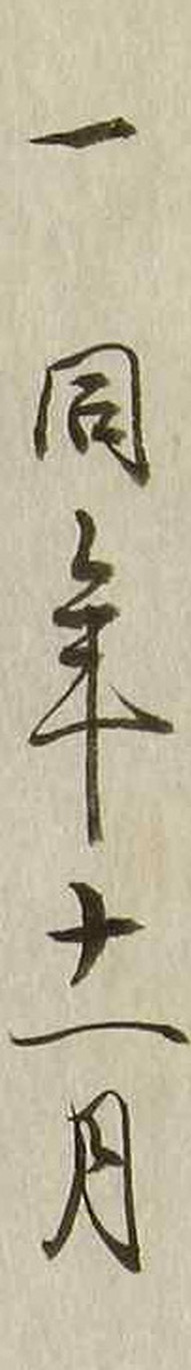一同年十一月
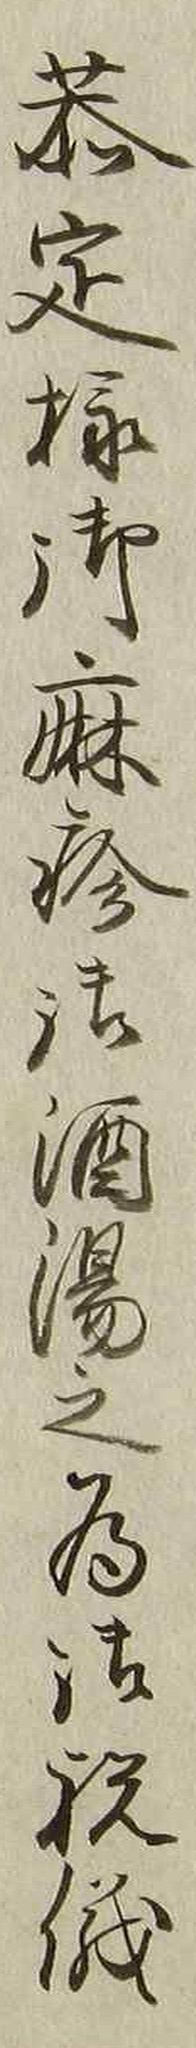恭定様御麻疹御酒湯之為御祝儀
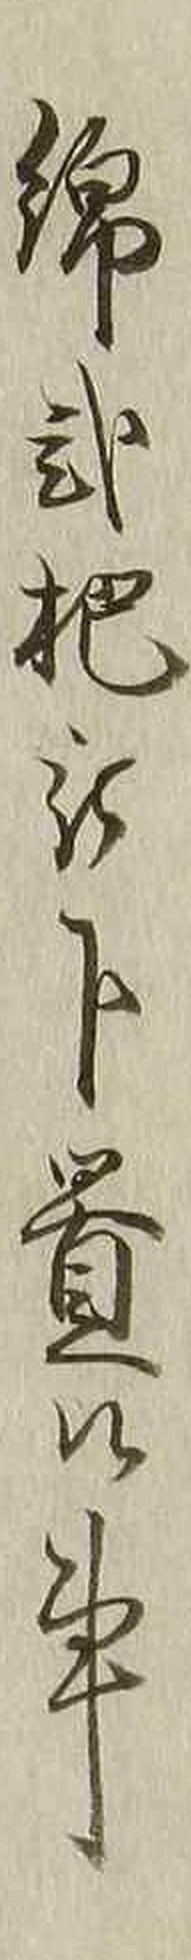綿弐把被下置候事
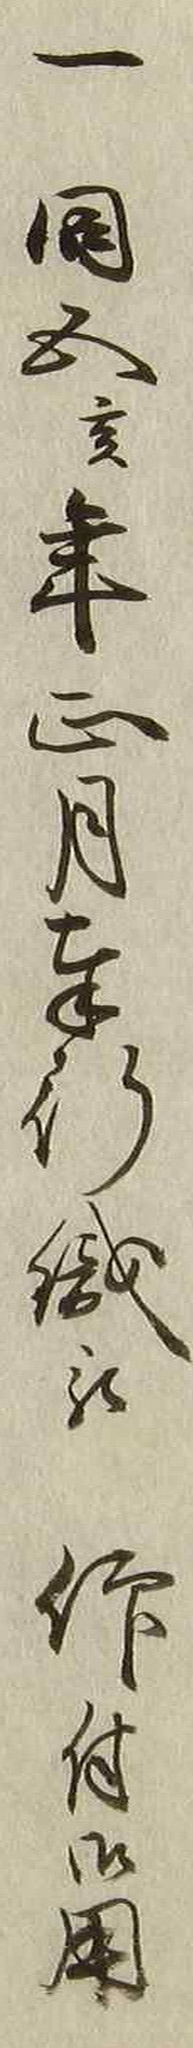一同五亥年正月奉行職被仰付御用
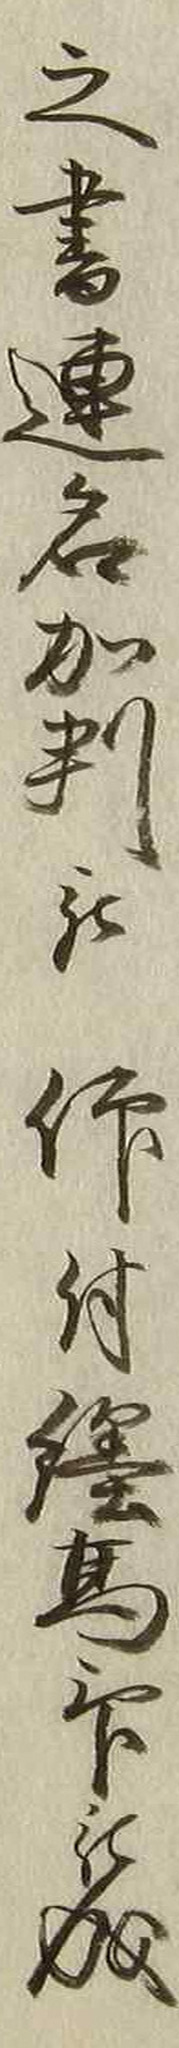之書連名加判被仰付纏馬印被成
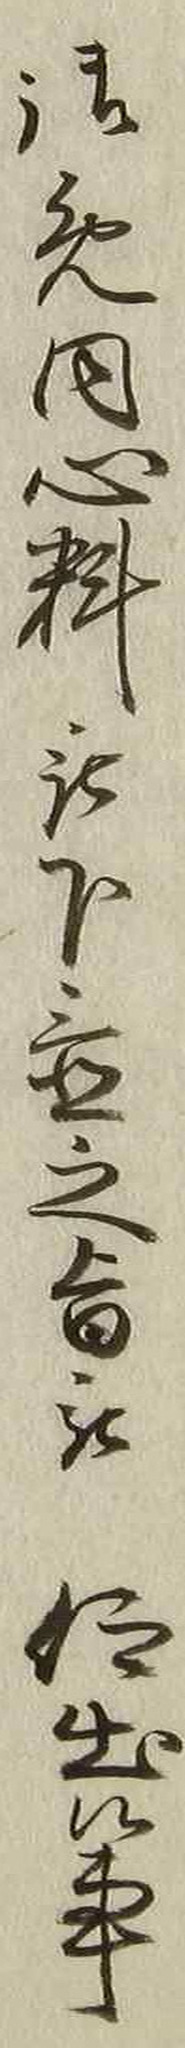御免同心料被下置之旨被仰出候事
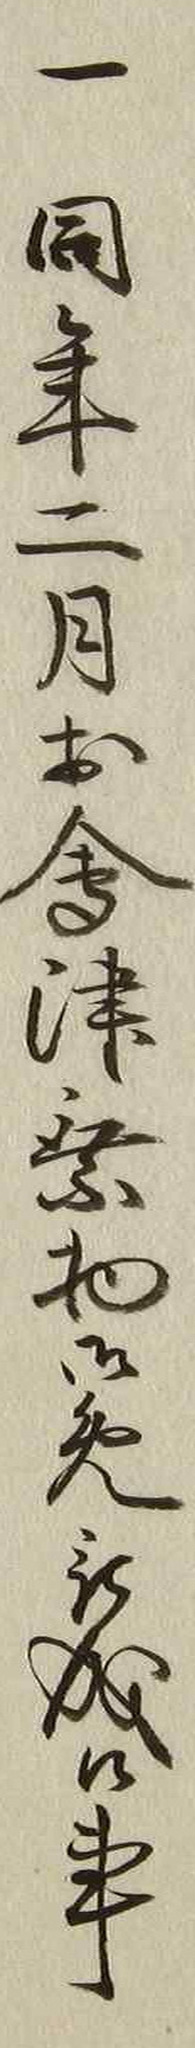一同年二月於会津乗物御免被成候事
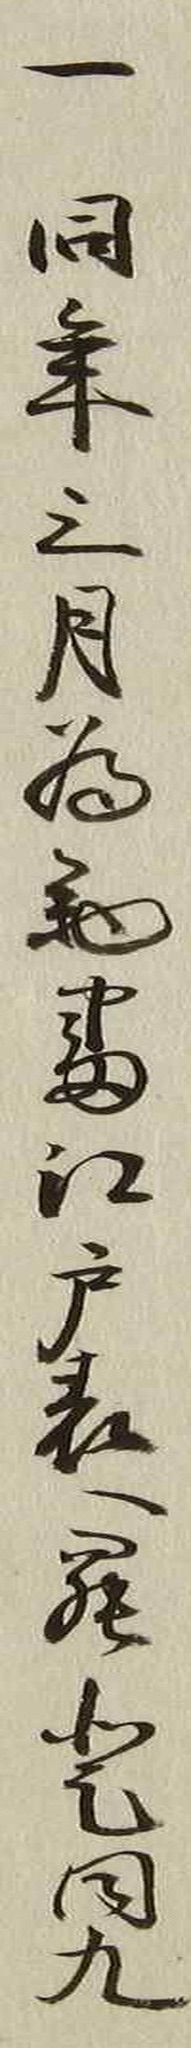一同年三月為勤番江戸表へ罷登同九
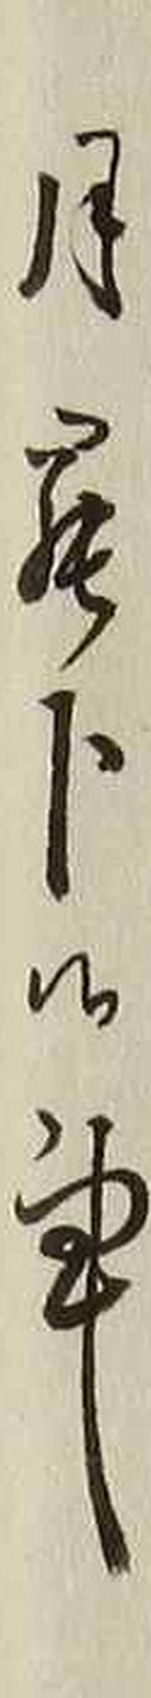月罷下候事
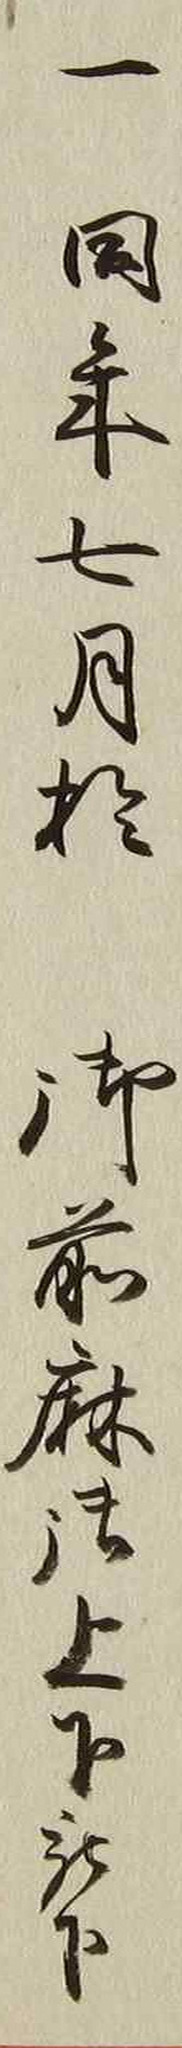一同年七月於御前麻御上下被下
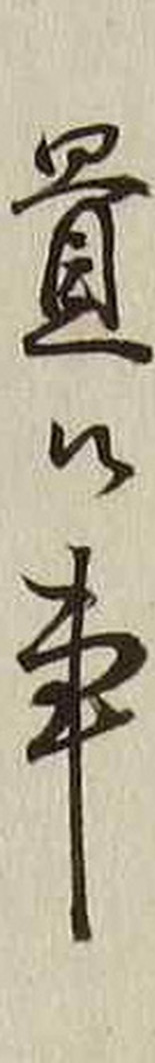置候事
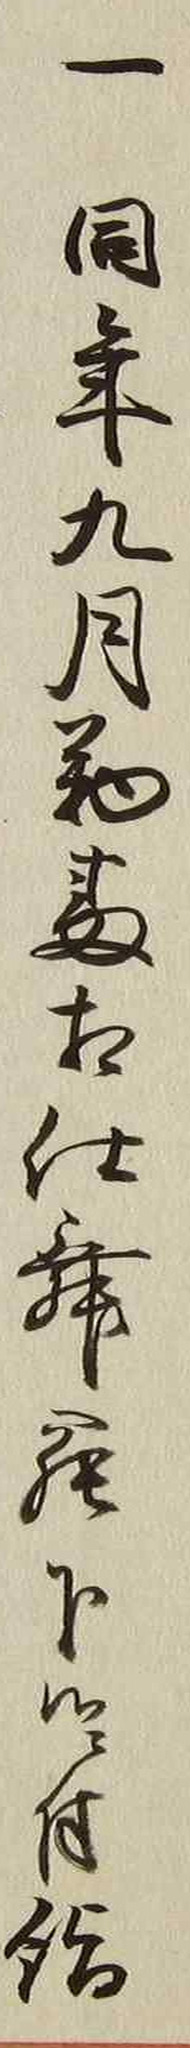一同年九月勤番相仕舞罷下候ニ付絹
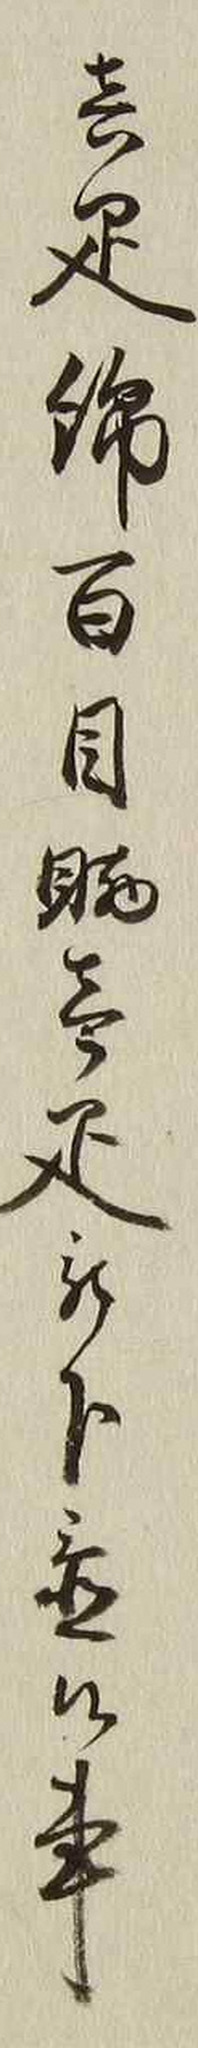壱疋綿百目晒壱疋被下置候事
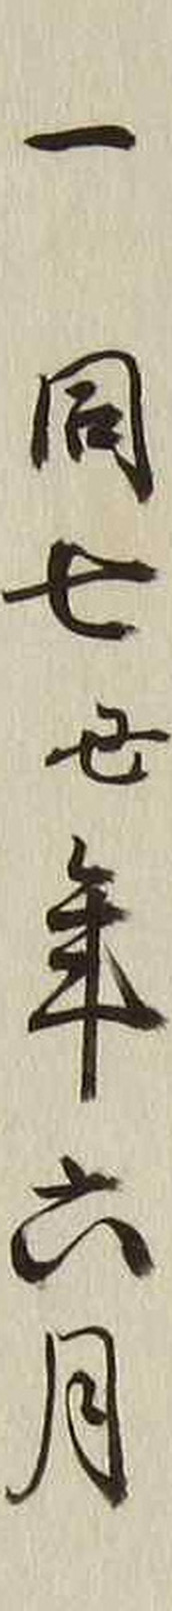一同七丑年六月
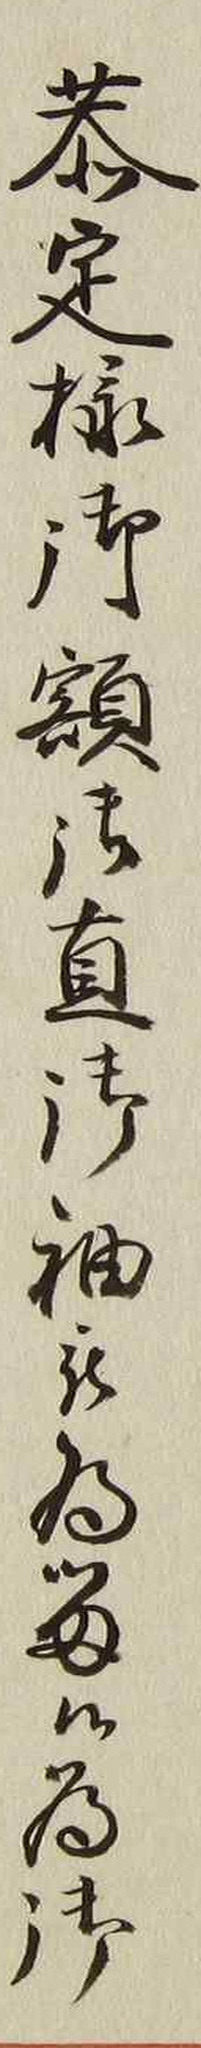恭定様御額御直御袖被為留候為御
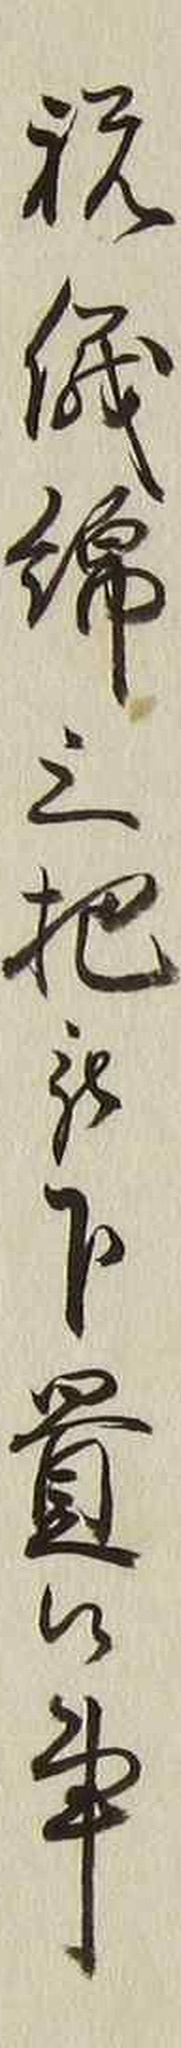祝儀綿三把被下置候事
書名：諸士系譜　巻之15　い之部15
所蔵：会津若松市立会津図書館
